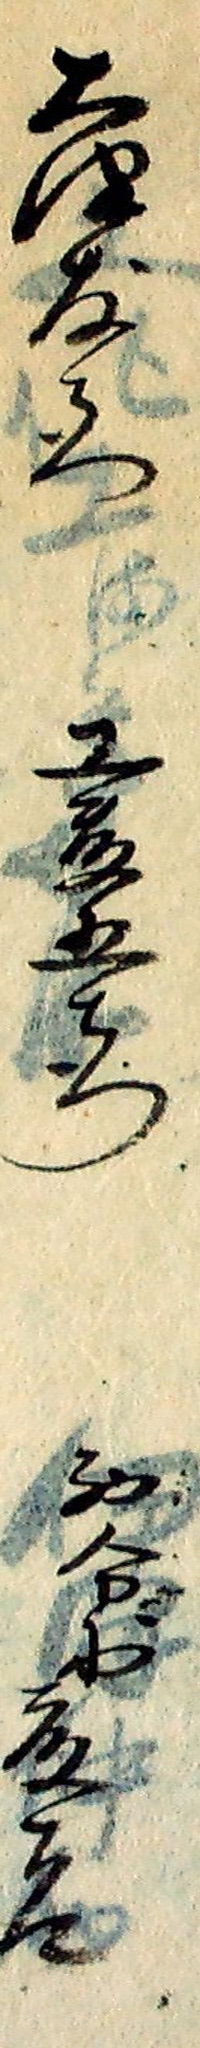大津友右衛門工藤五右衛門西分村藤吉
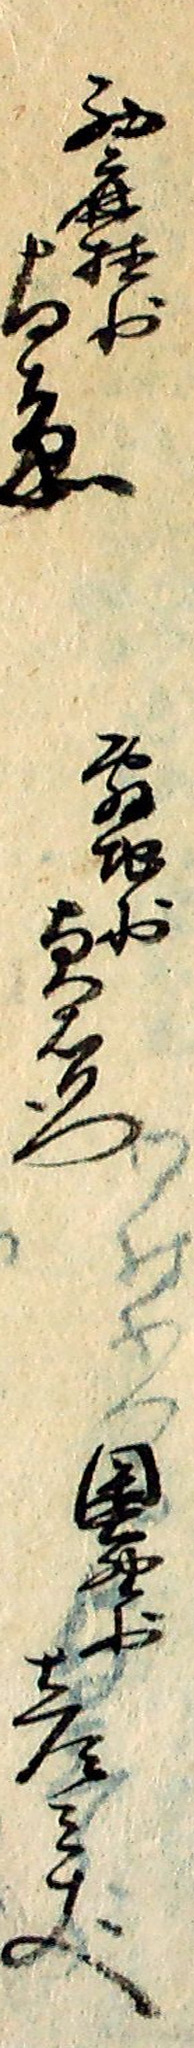西麻植村与兵衛敷地村貞右衛門奥野村彦之丈
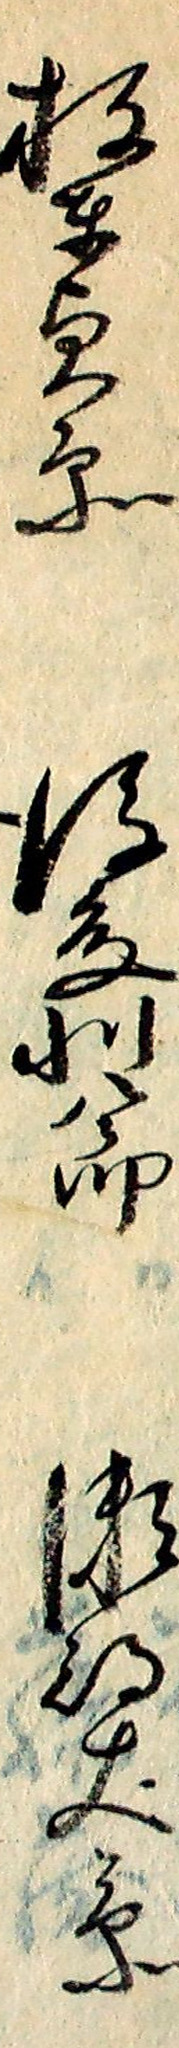板東貞兵衛後藤利八郎瀬都丈兵衛

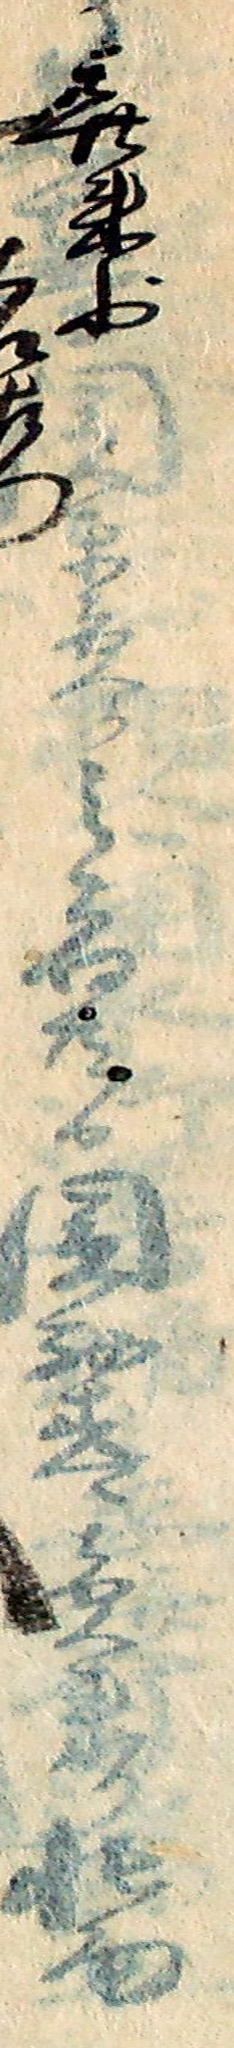喜来村吉左衛門
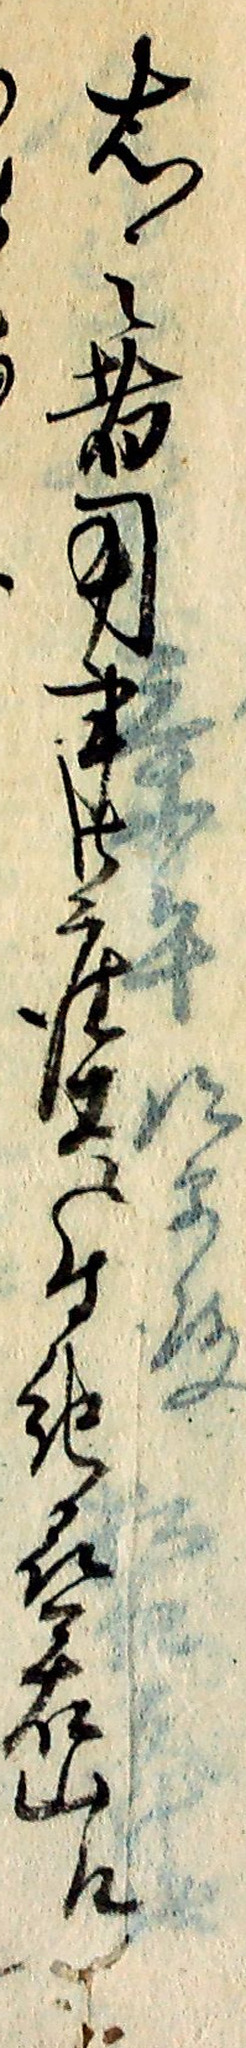右之者用事御座候に付紀州若山え
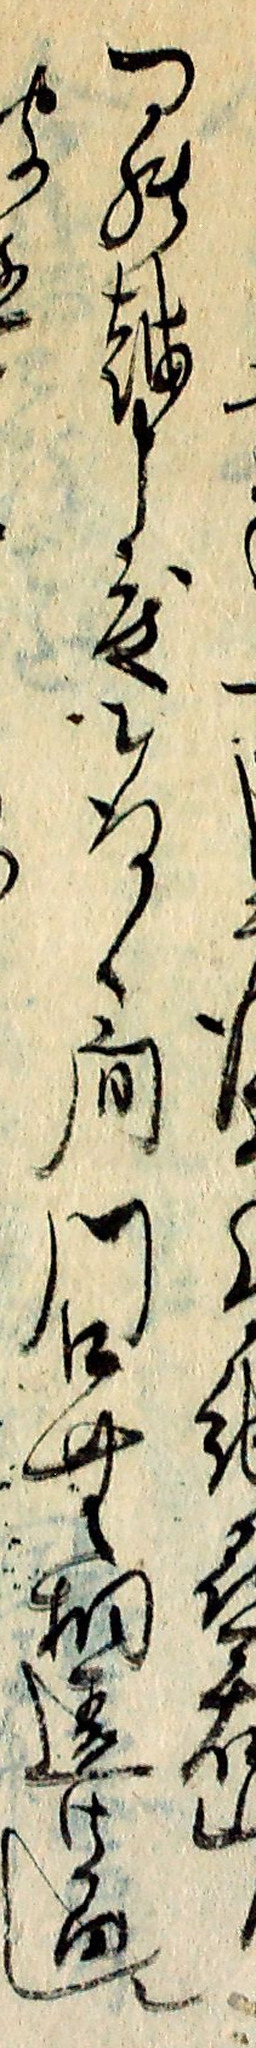罷越申度奉存候間川口無相違御通し
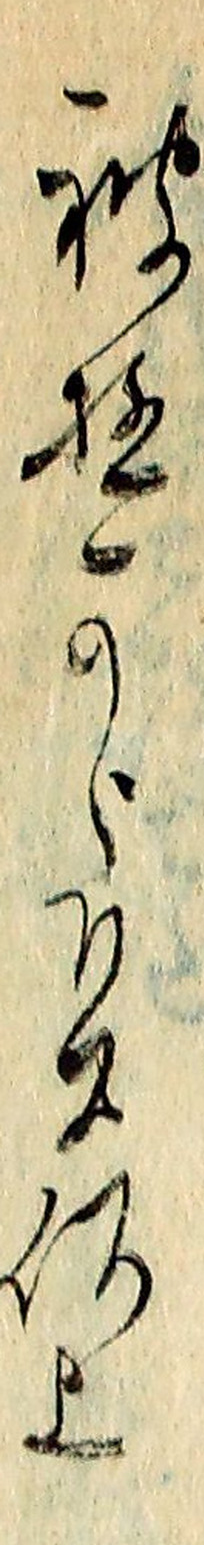被遊可被下候以上
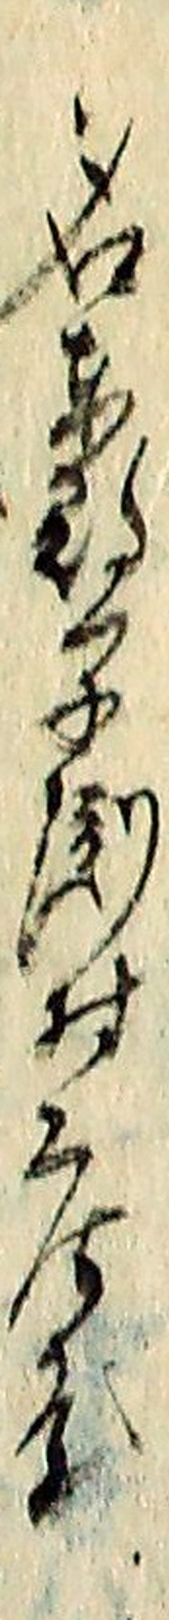名東郡早淵村庄屋
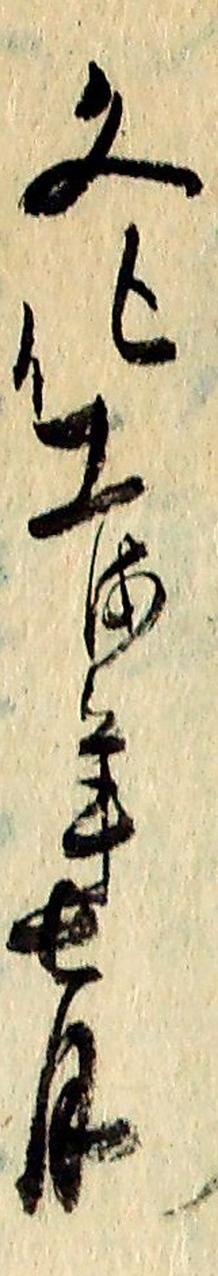文化十一戌年七月
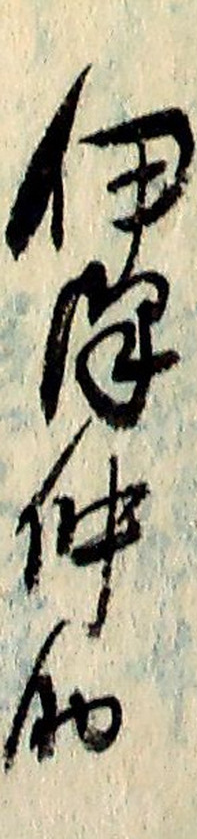伊沢仲助
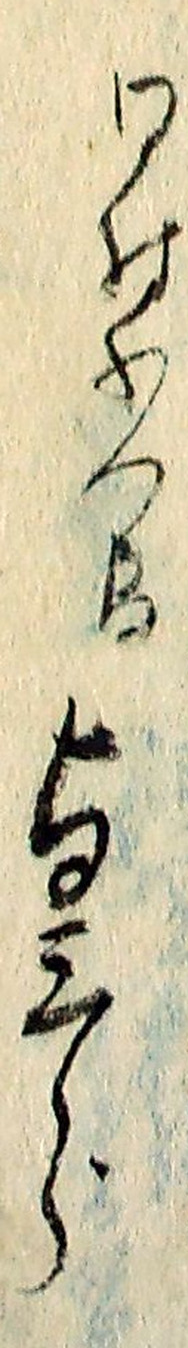同村五人与与三郎
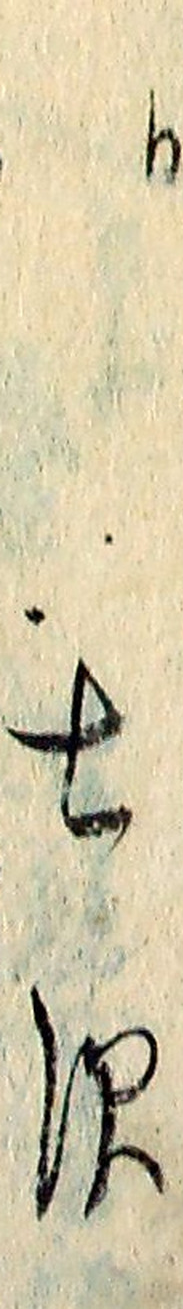同七次

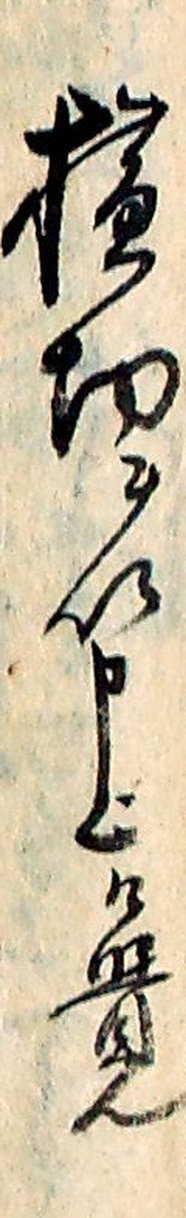横切を以申上候覚
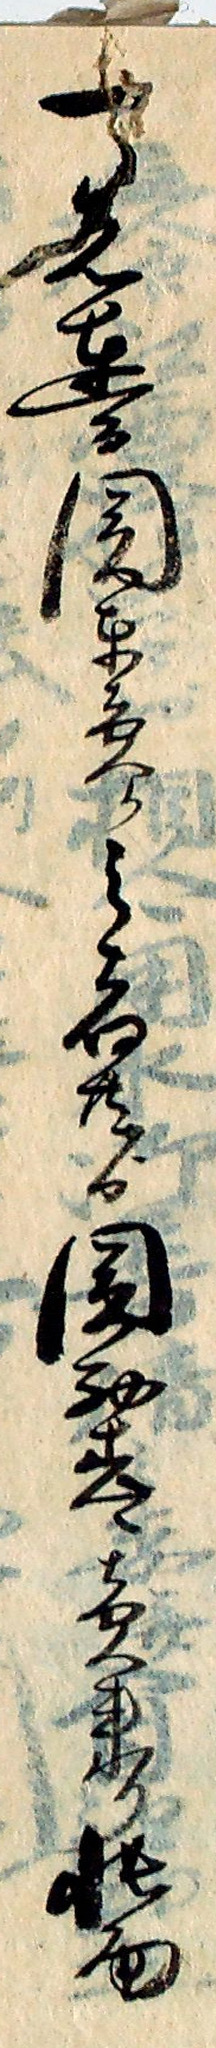一先達て関東売り之者共ゟ関西表へ売来り帳面
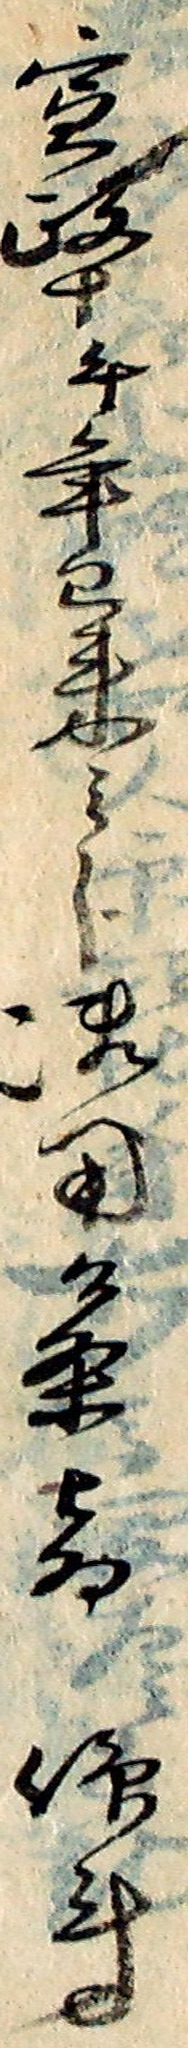寛政十午年已来之分御用候条被為仰付
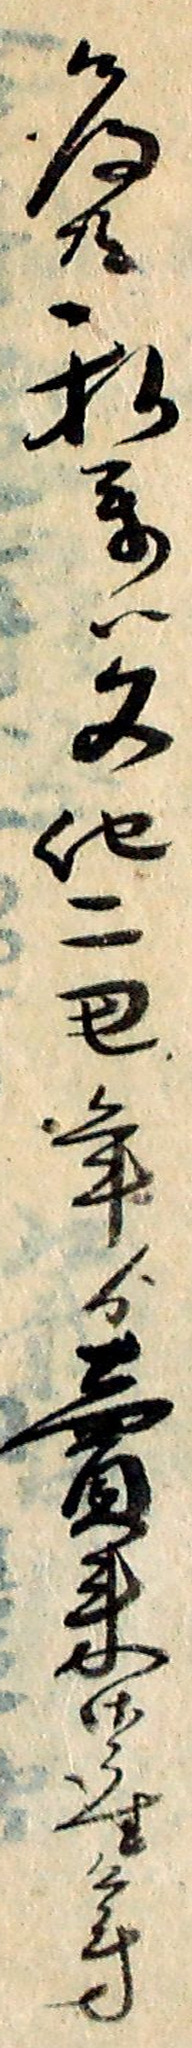候得共私義は文政二丑年ゟ売来御座候付
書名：諸御願書控(後藤氏壱番）
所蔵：鳴門教育大学 Naruto University of Education
